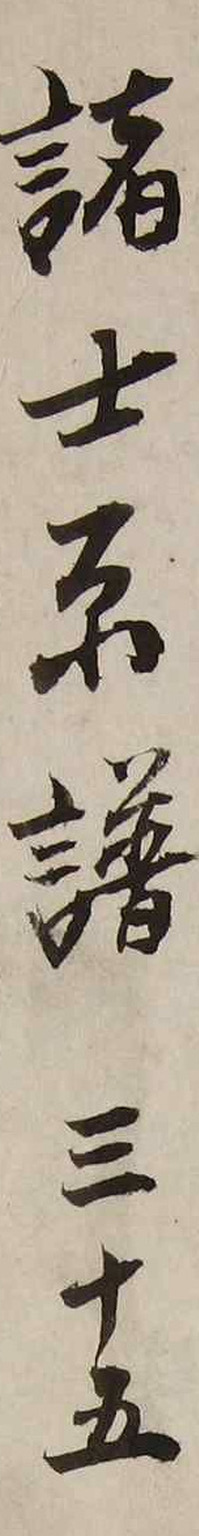諸士系譜三十五

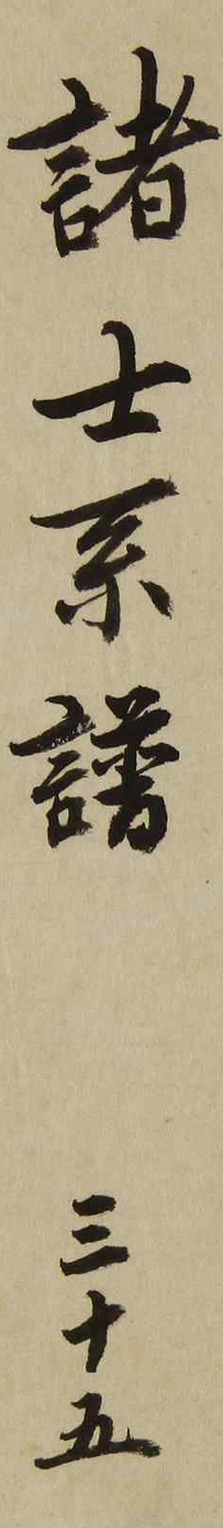諸士系譜三十五

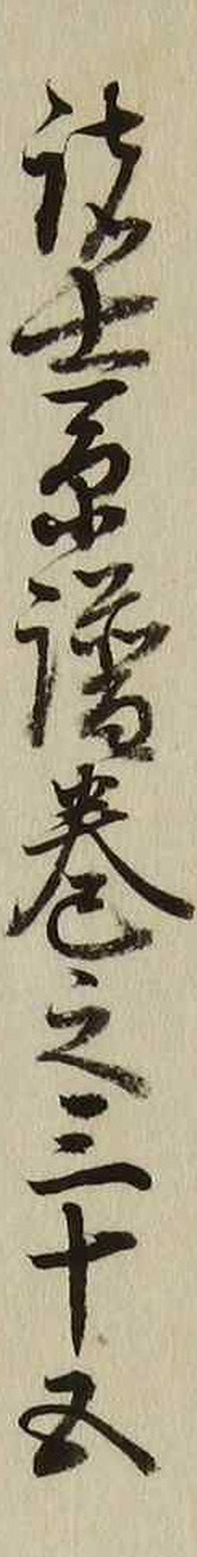諸士系譜巻之三十五
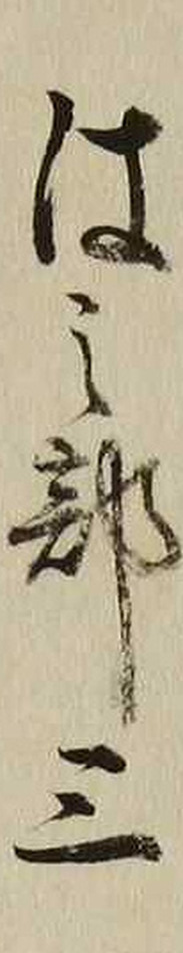は之部三
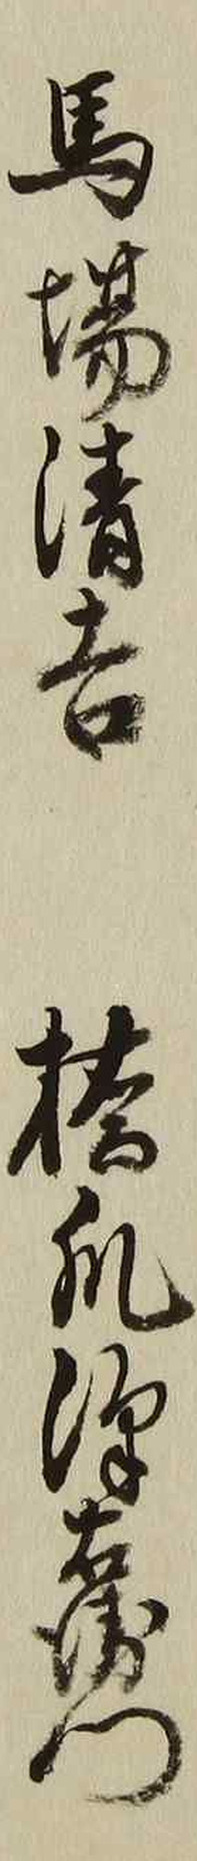馬場清吉橋爪沢右衛門
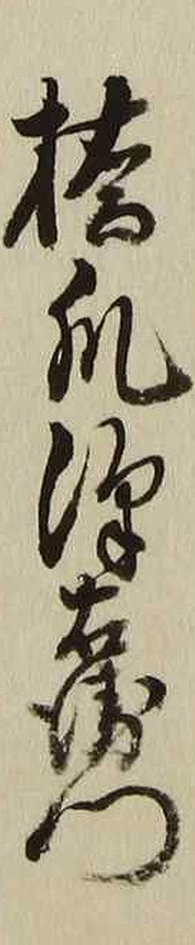馬場清吉橋爪沢右衛門

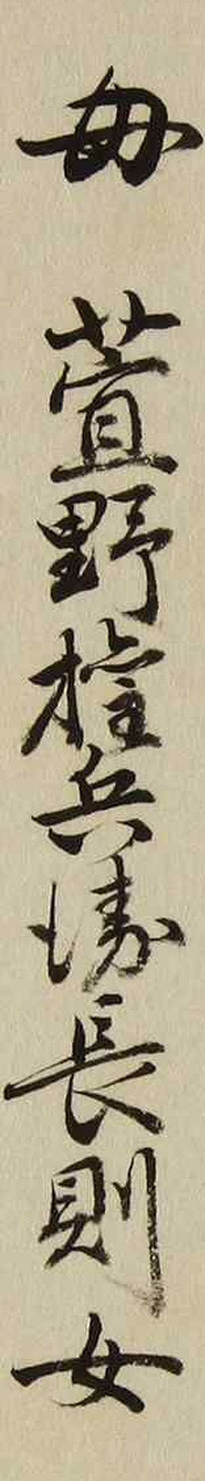母萱野権兵衛長則女
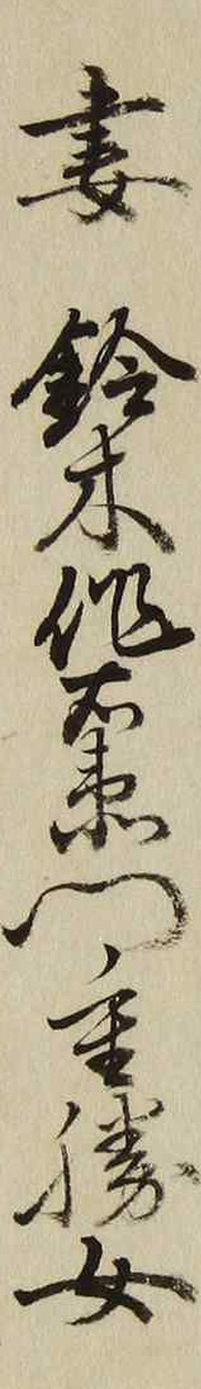妻鈴木作右衛門重勝女

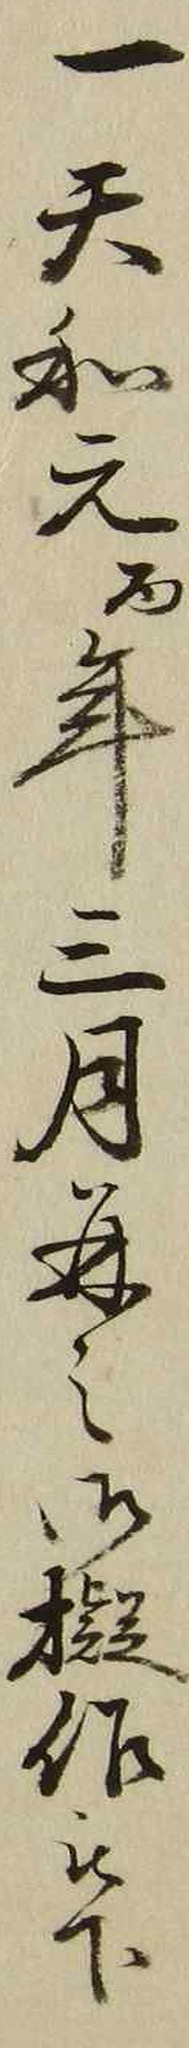一天和元酉年三月再之御擬作被下
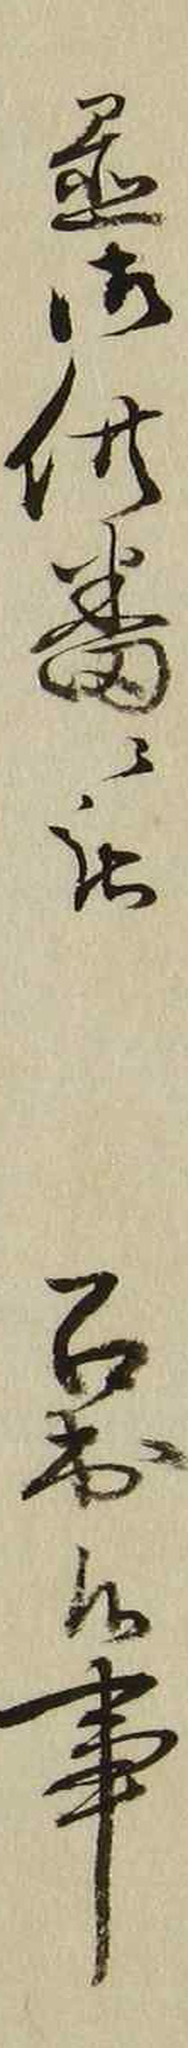置御供番ニ被召出候事
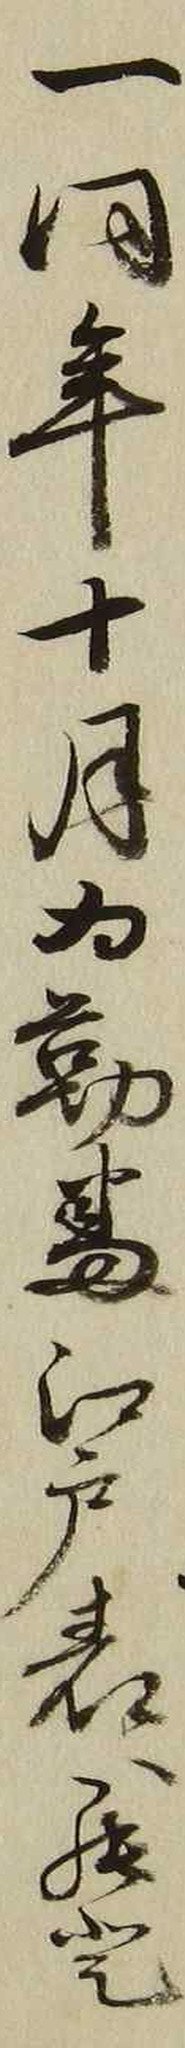一同年十月為勤番江戸表へ罷登
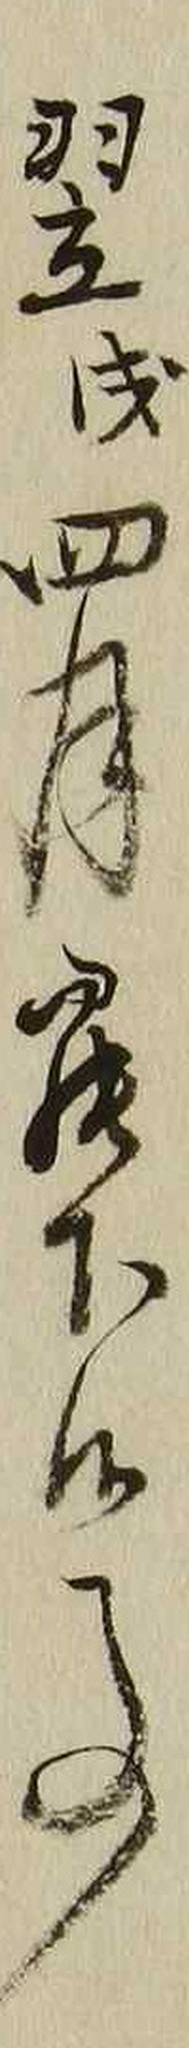翌戌四月罷下候事
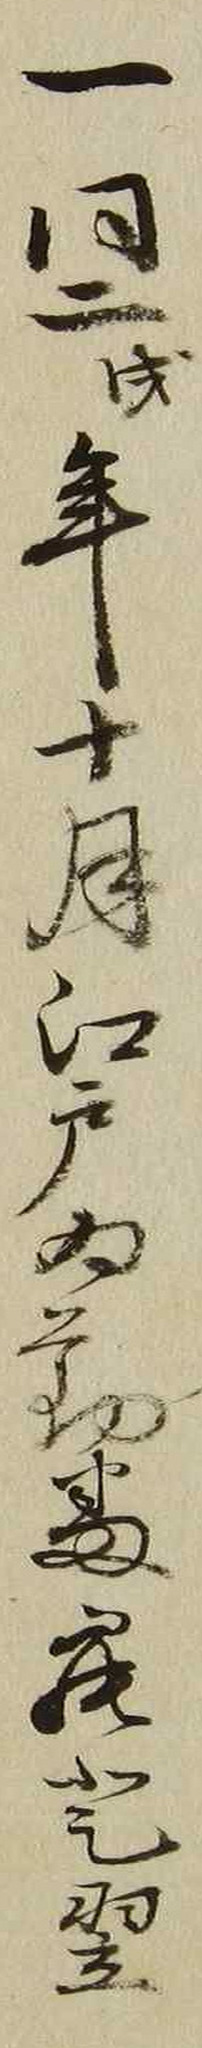一同二戌年十月江戸為勤番罷登翌
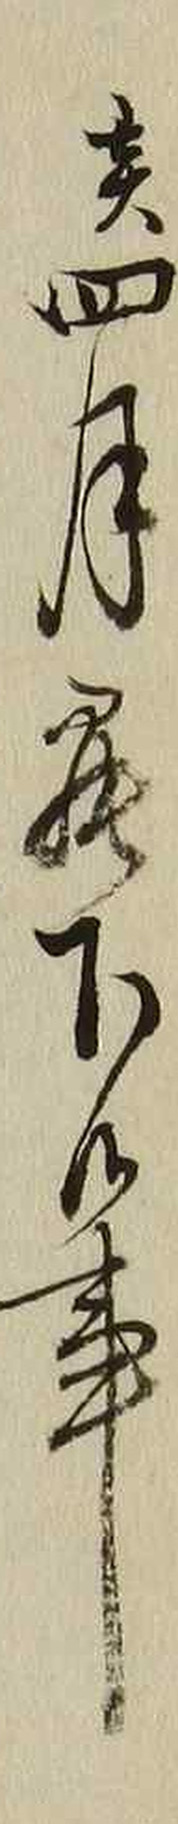亥四月罷下候事
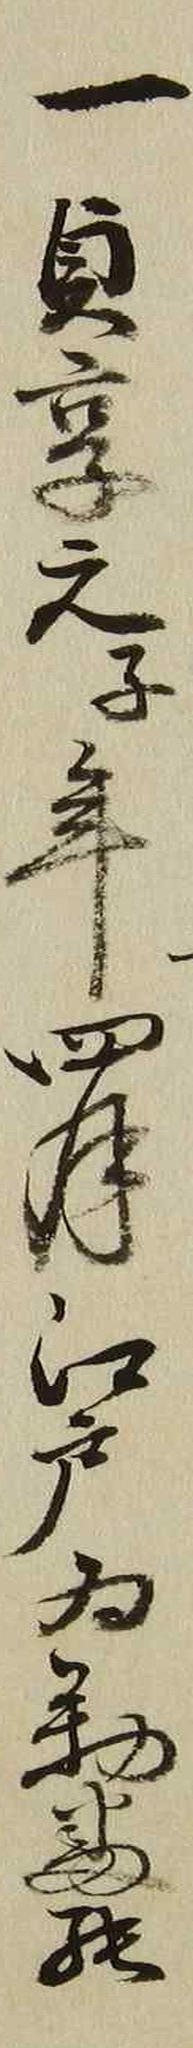一貞享元子年四月江戸為勤番罷
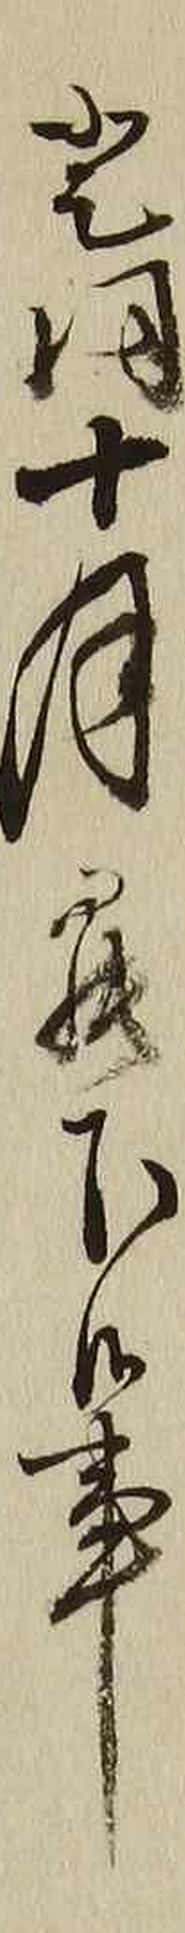登同十月罷下候事
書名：諸士系譜　巻之35　は之部3
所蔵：会津若松市立会津図書館
